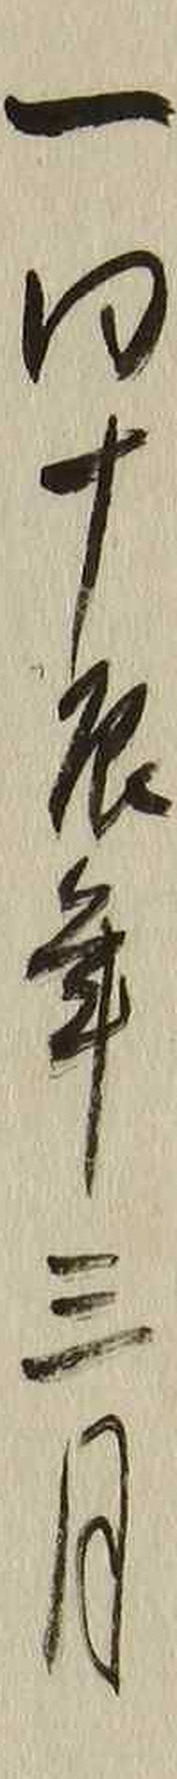一同十辰年三月
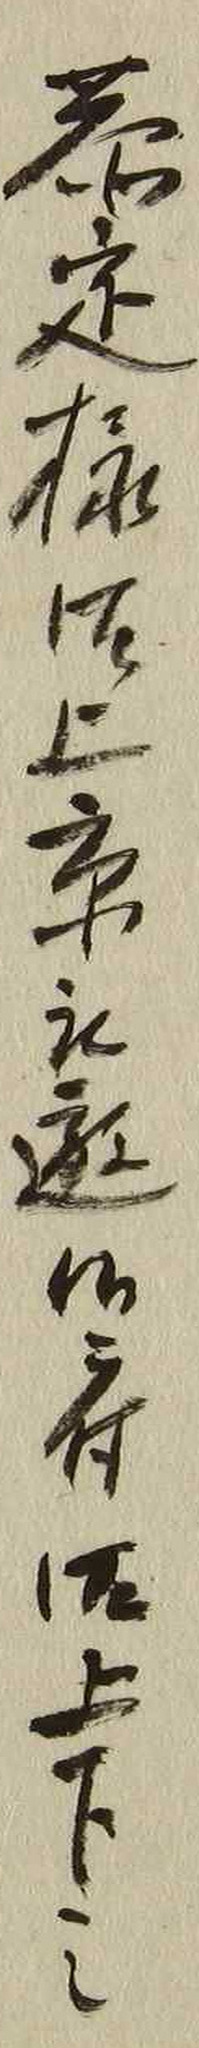恭定様御上京被遊候ニ付御上下之
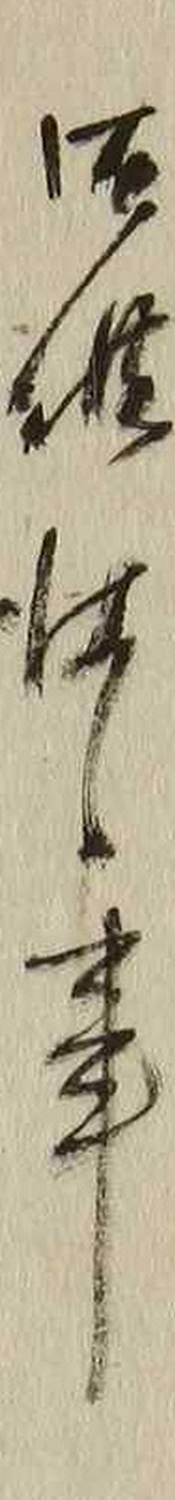御供仕候事
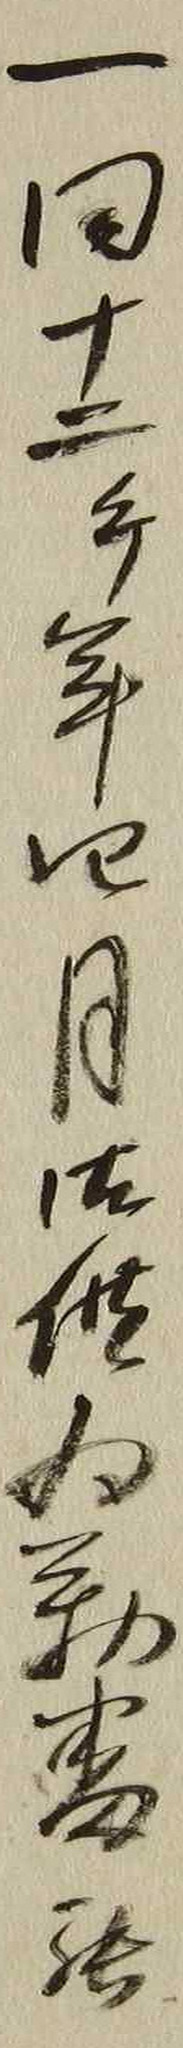一同十二午年四月御供為勤番罷
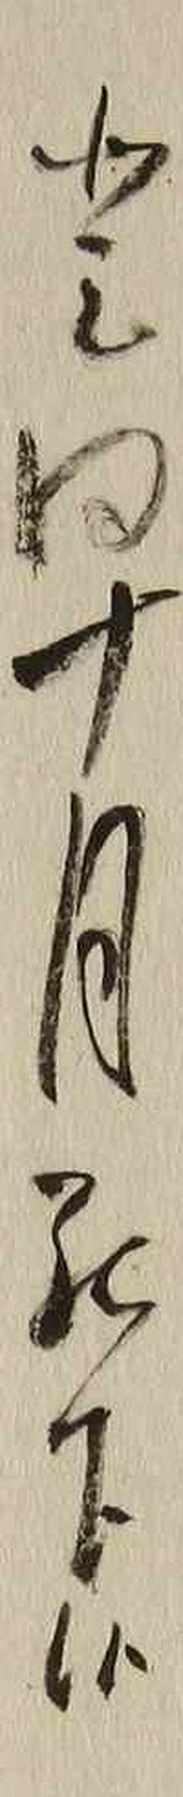登同十月罷下候
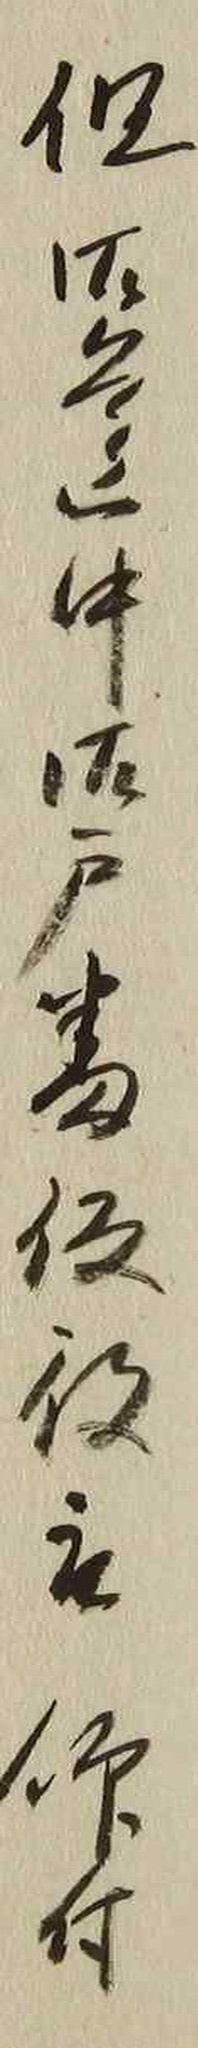但御道中御戸番仮役被仰付
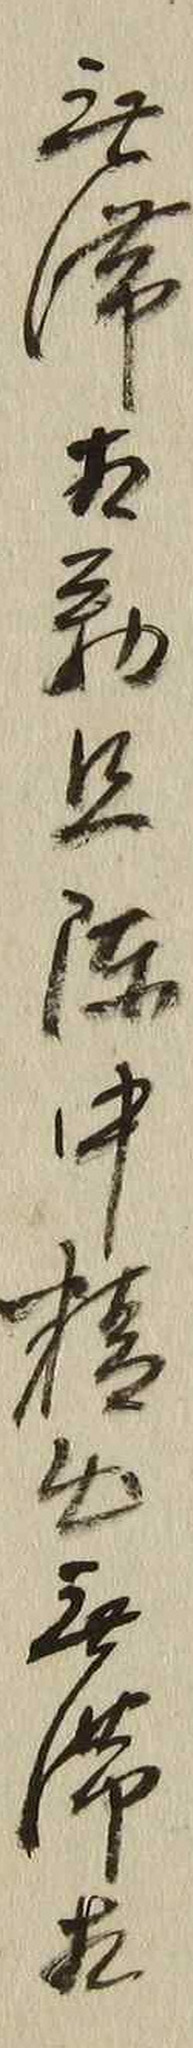無滞相勤且陣中精出無滞相
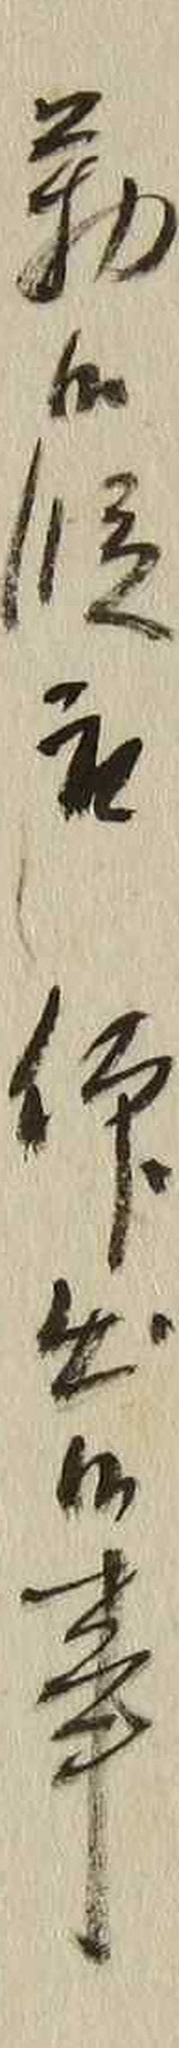勤候段被仰出候事
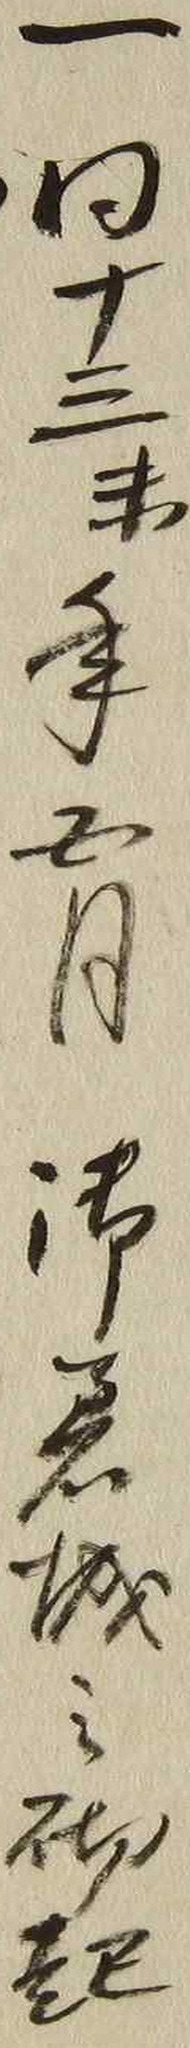一同十三未年五月御着城之砌起
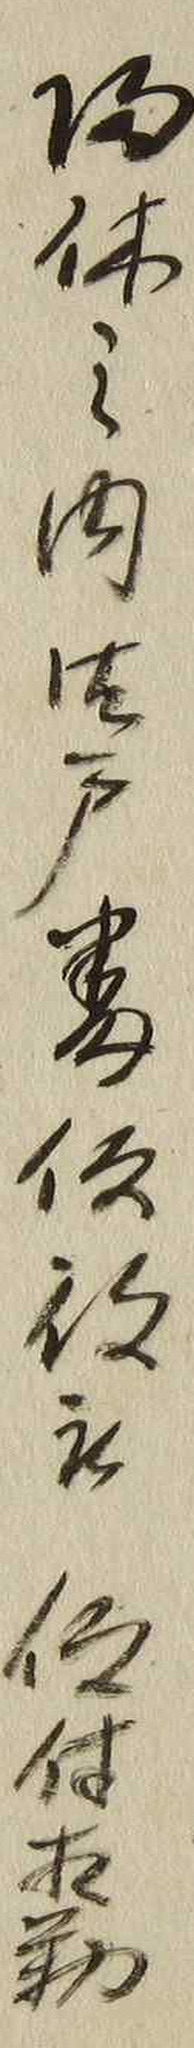帰休之内御戸番仮役被仰付相勤
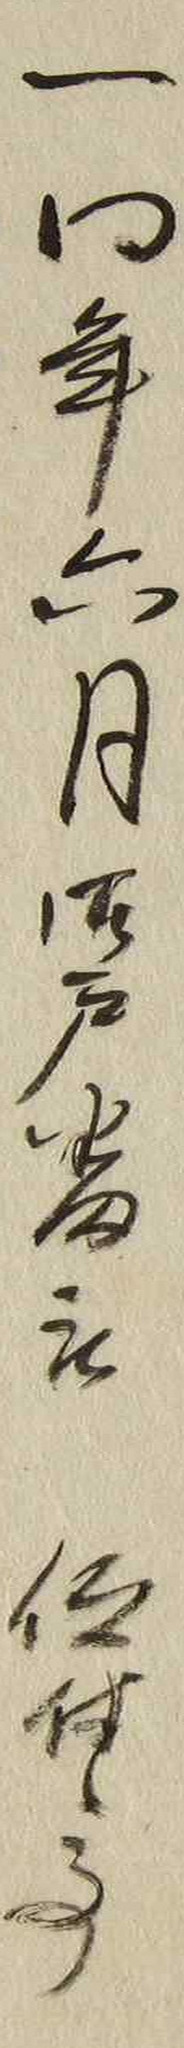一同年六月御戸番被仰付候事
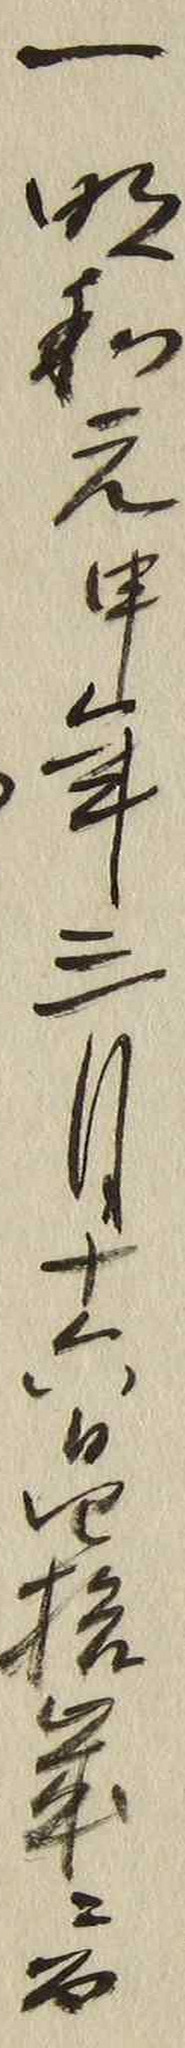一明和元申年三月十六日四拾歳ニ而
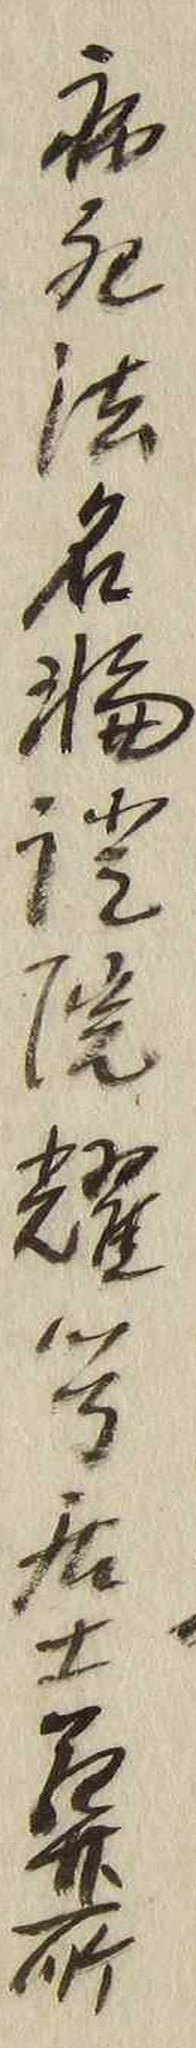病死法名輪証院耀等居士葬所

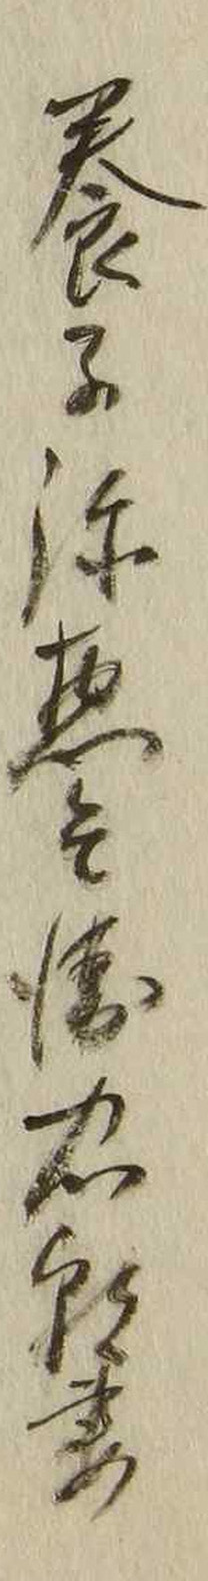女養子弥惣兵衛忠朝妻
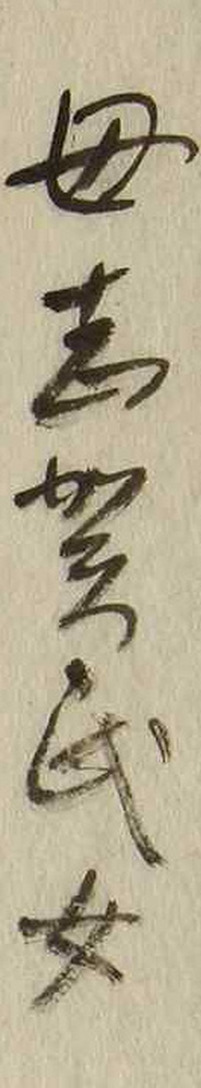母志賀氏女
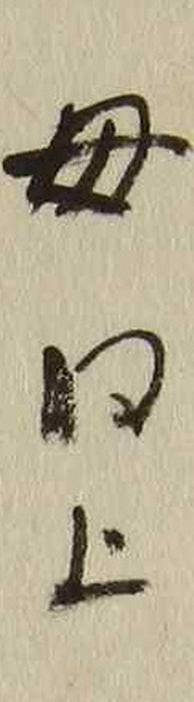母同上
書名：諸士系譜　巻之359　す之部9
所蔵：会津若松市立会津図書館
